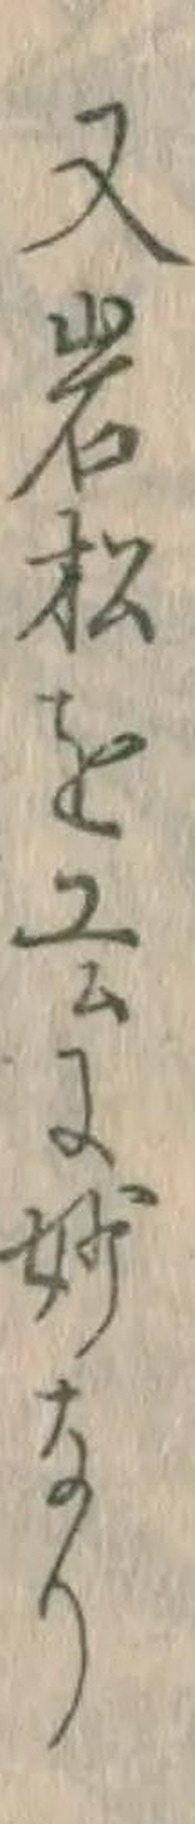又岩松を工むに妙なり
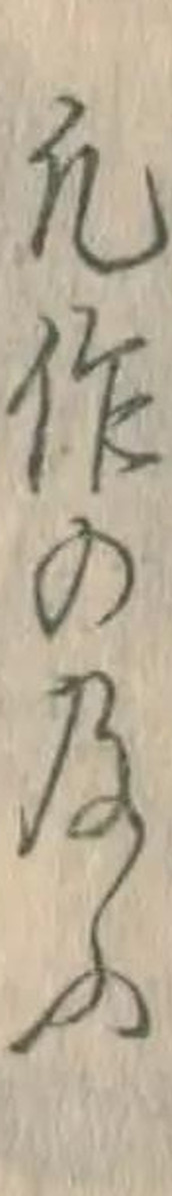凡作の及ふ
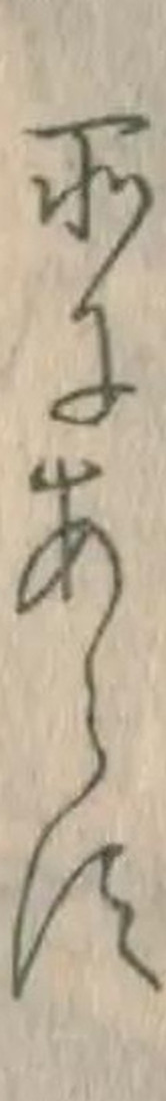所にあらす
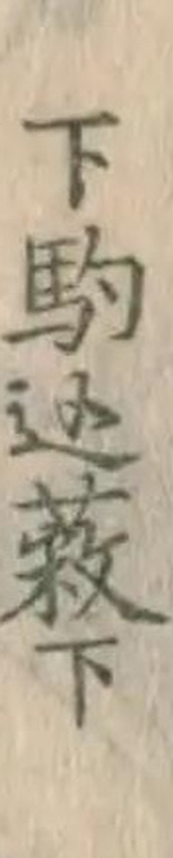下駒込薮下
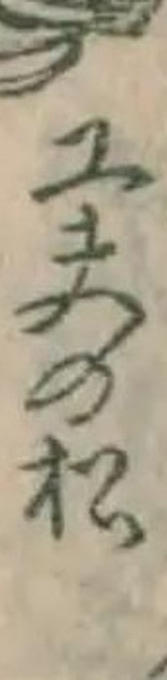工夫の松

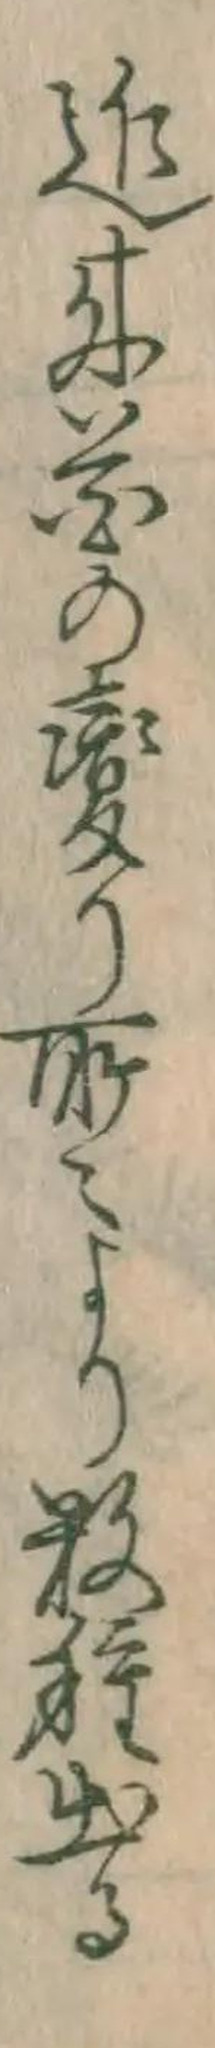近来花の変り所により数種出る
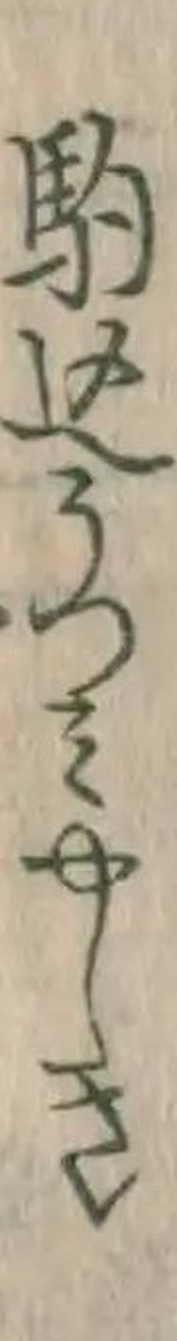駒込うつみやしき
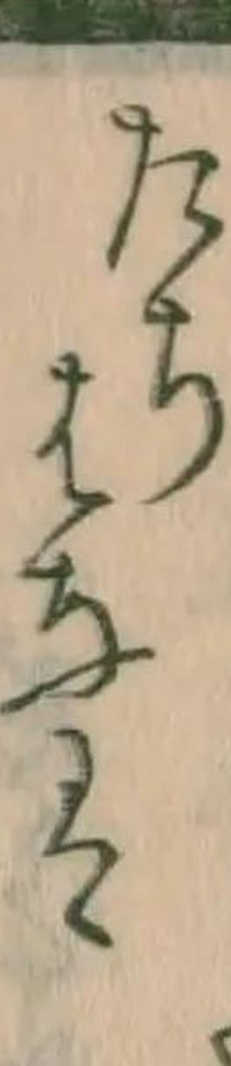はなは
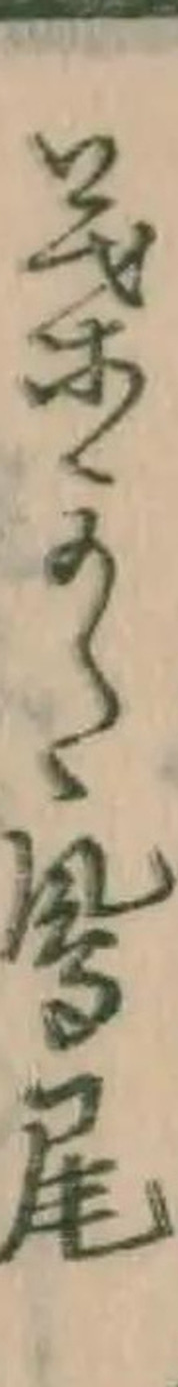葉かた鳳尾
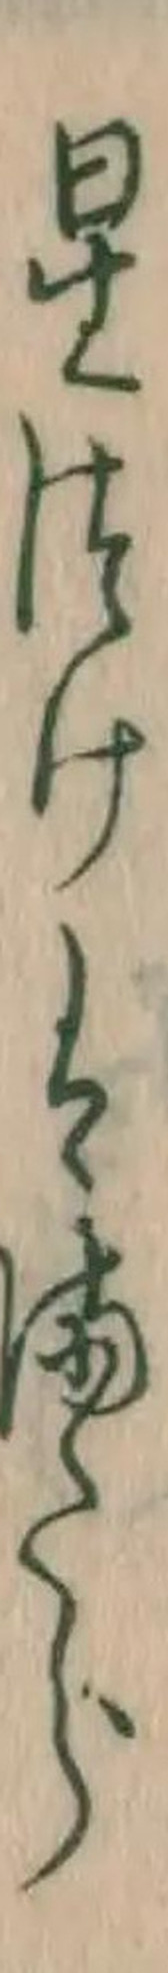星つけはまたら
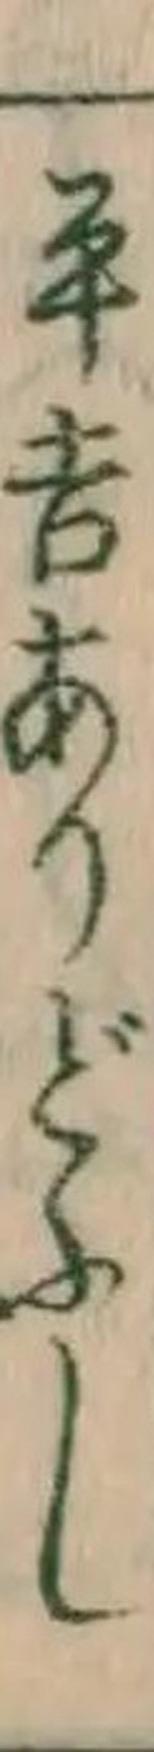平吉ありどふし
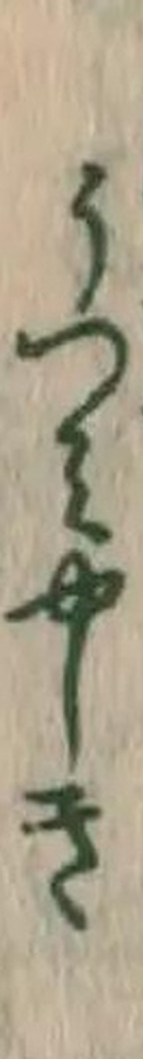うつみやしき
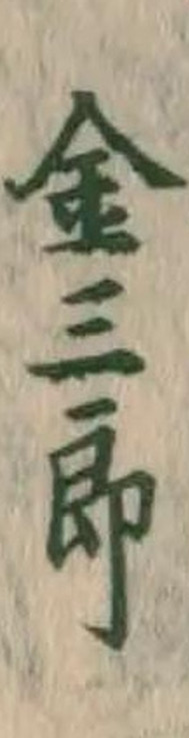金三郎
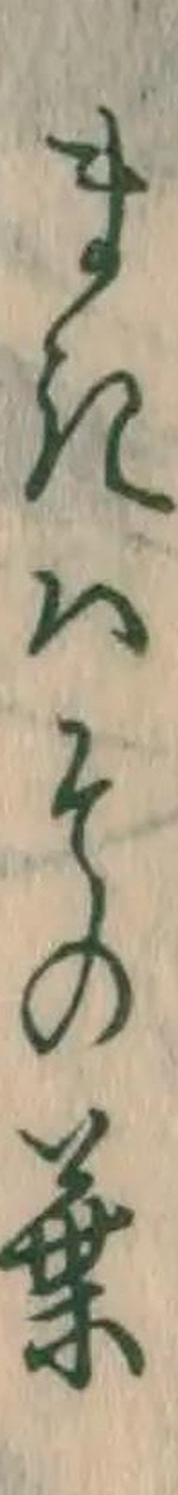まきはその葉
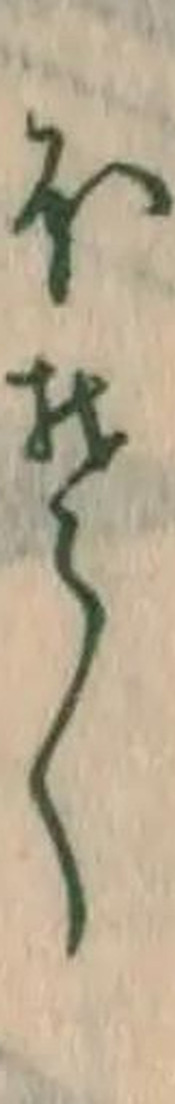ほそく
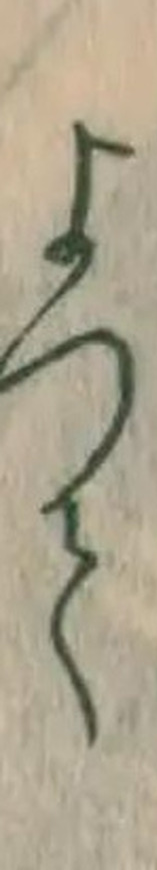よつて
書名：草木奇品家雅見 3巻. [3]
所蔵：国立国会図書館 National Diet Library, JAPAN
